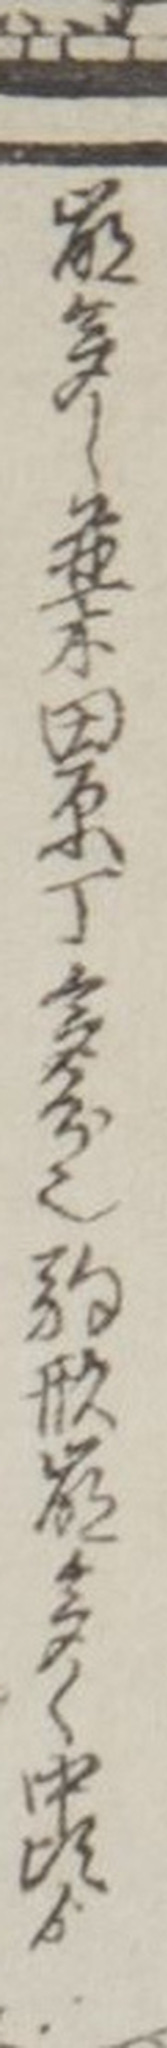崩多し並木田原丁多分也駒形崩多く中頃ゟ
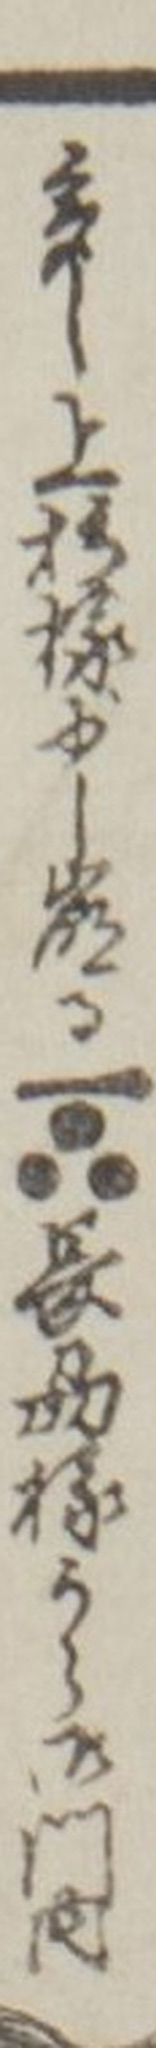多し上杉様少し崩る「家紋」長州様うら御門内
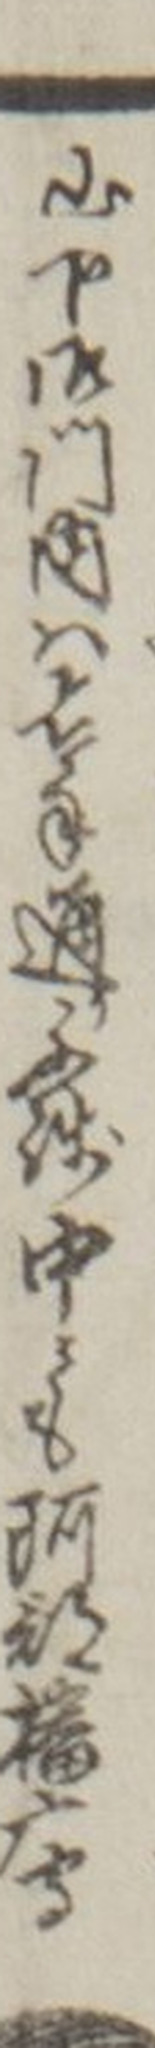山下御門内は長手通り不残中にも阿部播磨守
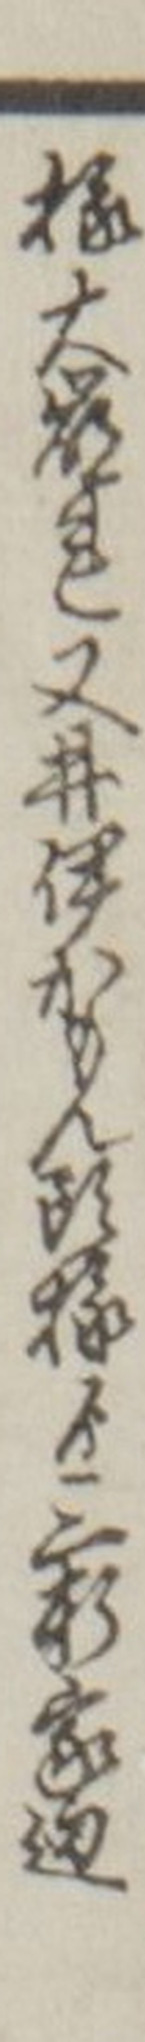様大崩れ又井伊かもん頭様ゟ三軒家辺
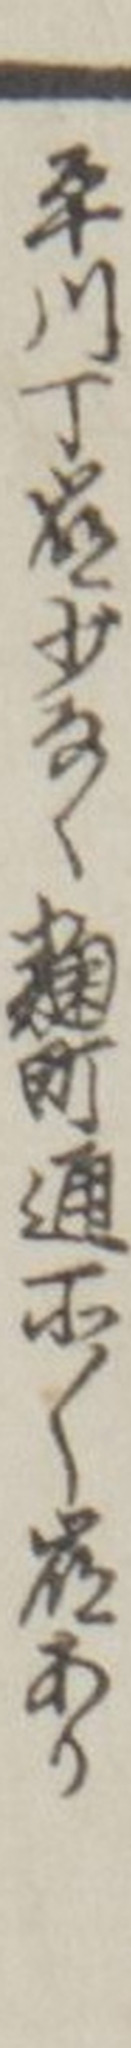平川丁崩少なく麹町通所〳〵崩あり
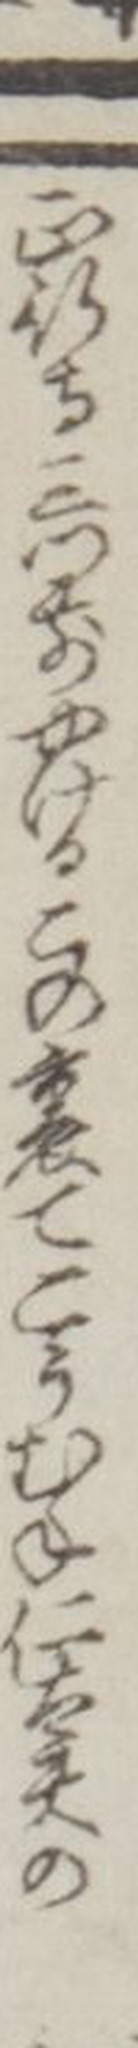正行寺三門前やけるこの裏てこうむね仁太夫の
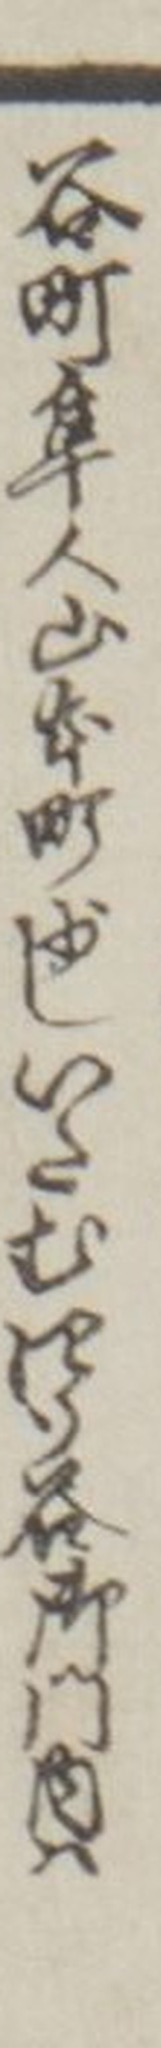谷町隼人山本町少しいたむ四ツ谷御門内は
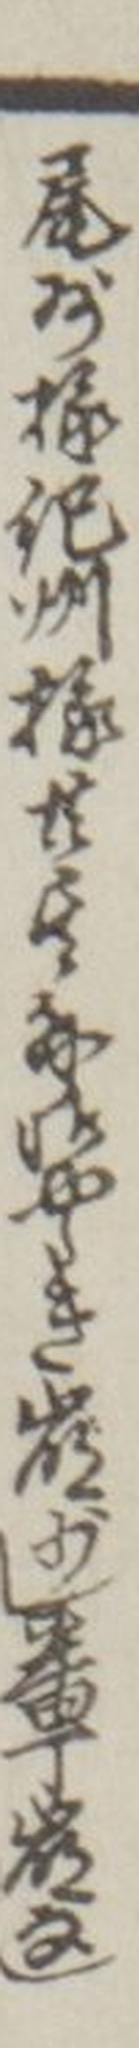尾州様紀州様共其両御やしき崩少し番丁崩なし
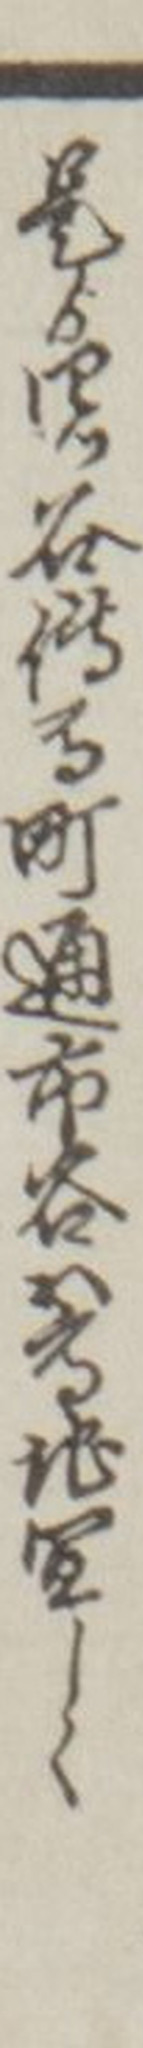是ゟ四ッ谷伝馬町市谷は高地よ宜しく
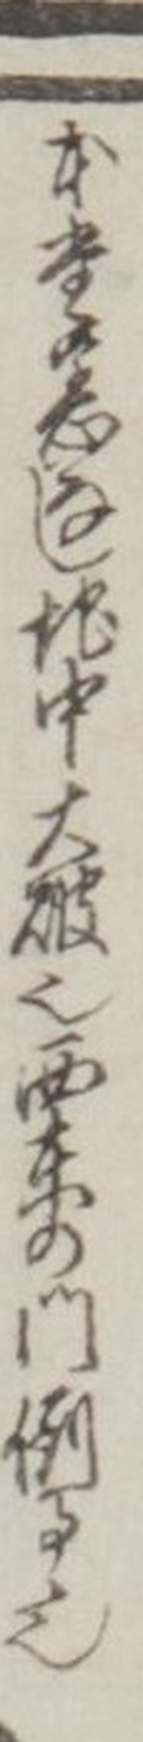本堂恙なし地中大破也西東の門倒るゝ也
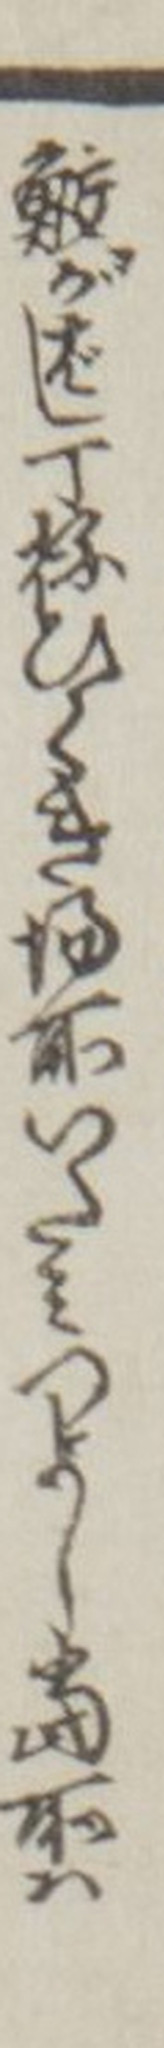鮫がばし丁抔ひくき場所いたみつよし当所は
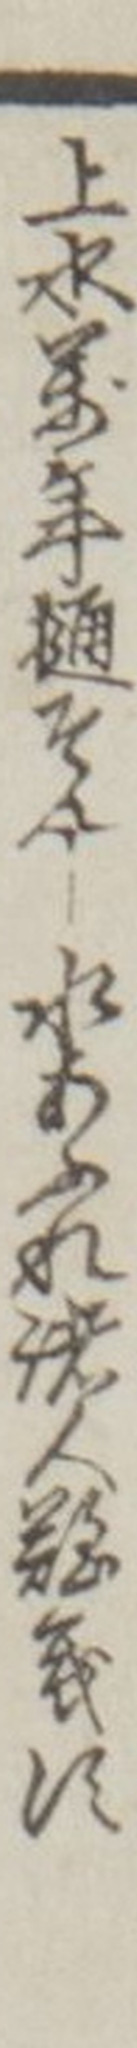上水万年樋そんし水あふれ諸人難義す
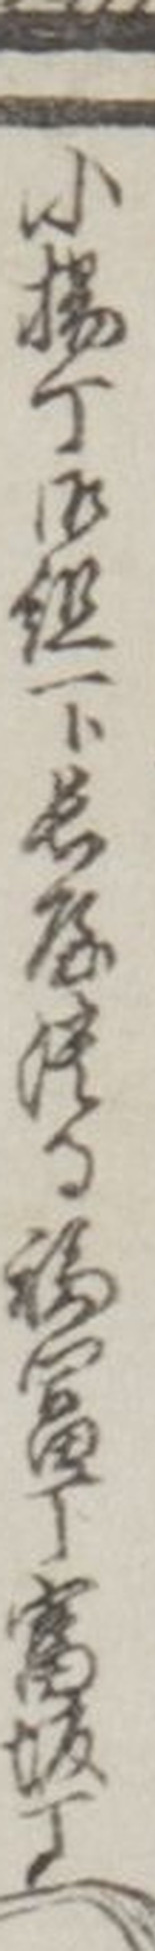小揚丁御組下長屋潰る稲富丁富坂丁
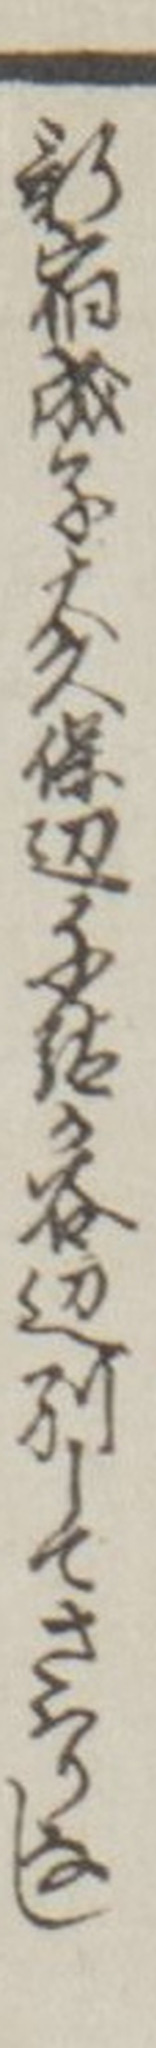新宿成子大久保辺千駄か谷辺別してさはりなし
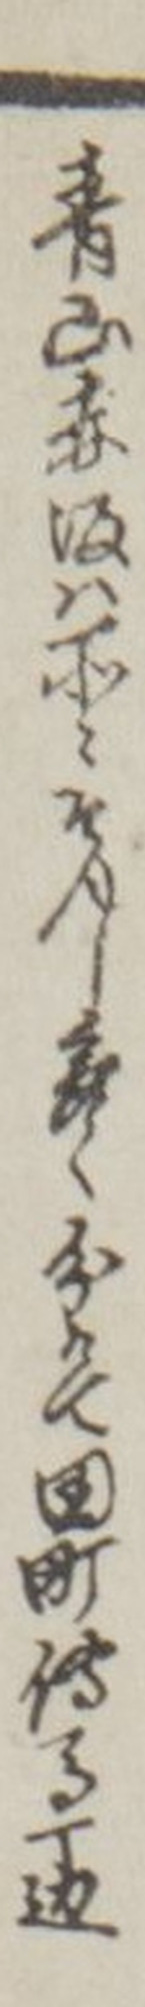青山赤坂は所々そんし多く分けて田町伝馬丁辺
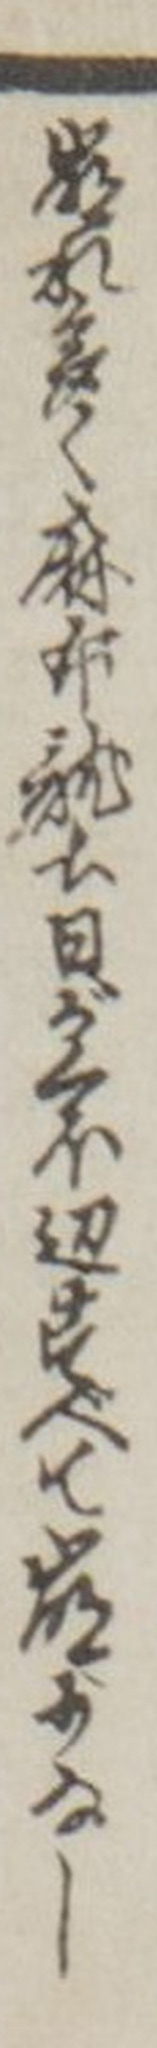崩れ多く麻布龍土日がくほ辺すべて崩れなし
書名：大地震記事
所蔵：あいおいニッセイ同和損保株式会社
